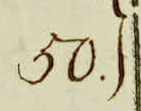50.
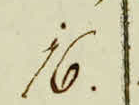16.
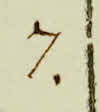7.
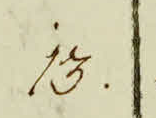13.
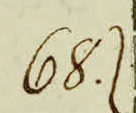68.
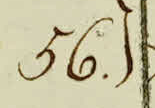56.
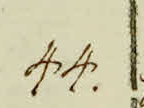44.
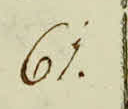61.
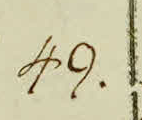49.
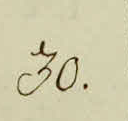30.
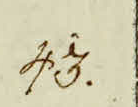43.
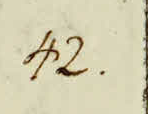42.
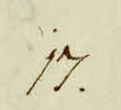17.
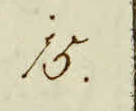15.
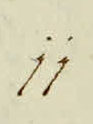11
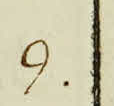9.
